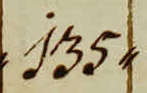135
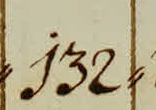132
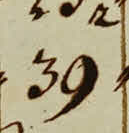39
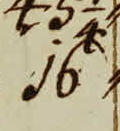16
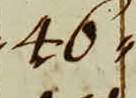46
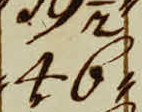46
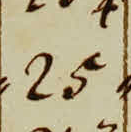25
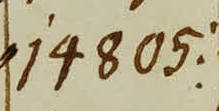14805
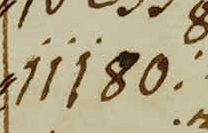11180.
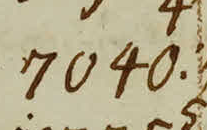7040
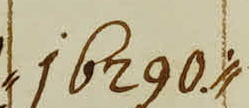16290.
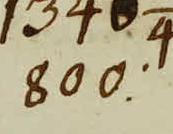800.
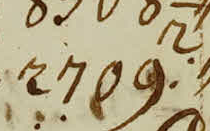2709.
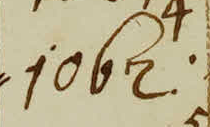1062.
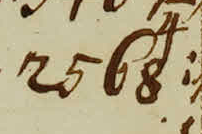2568
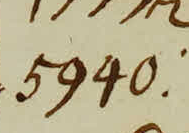5940
